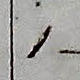1
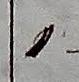1
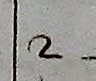2
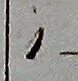1
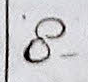8
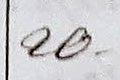20
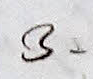3
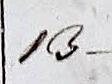13
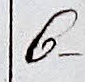6
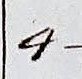4
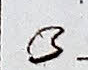3
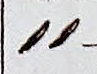11
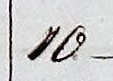10
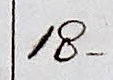18
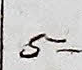5
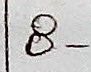8
